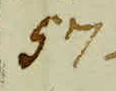57
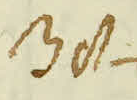38
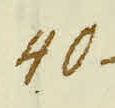40
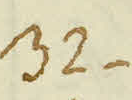32
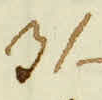31
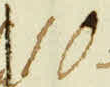10
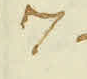7
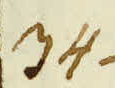34
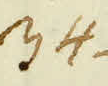34
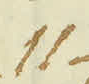11
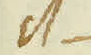8
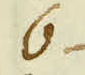6
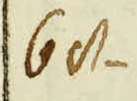68
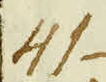41
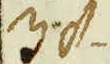38
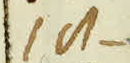18
